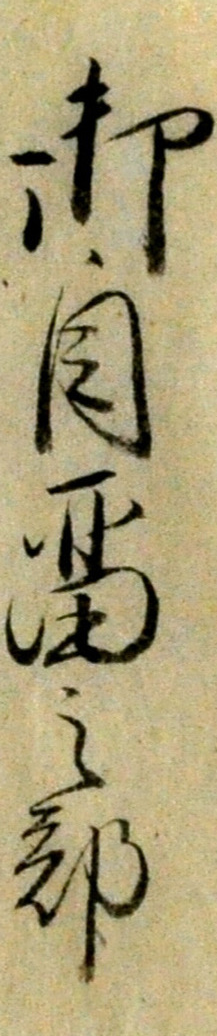御自留之部
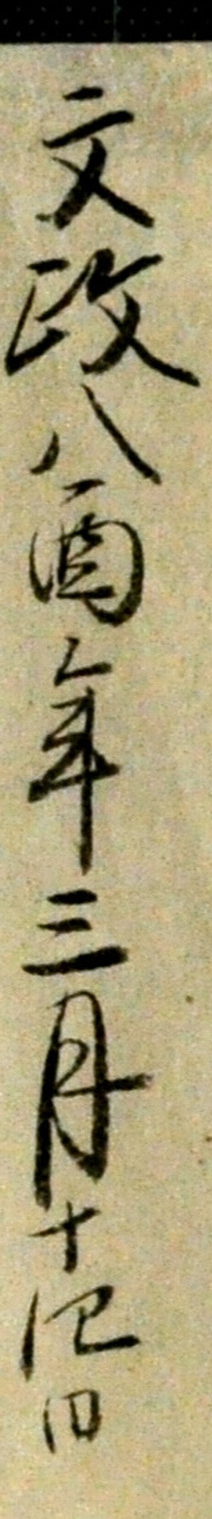文政八酉年三月十四日
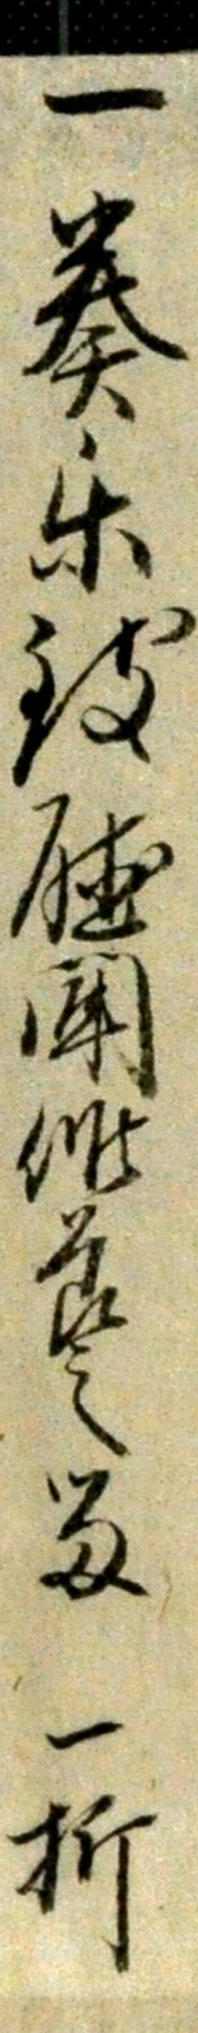一奏楽致聴聞候節之留一折
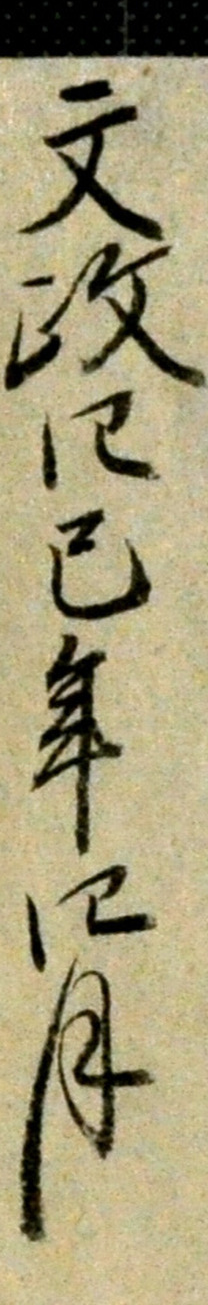文政四巳年四月
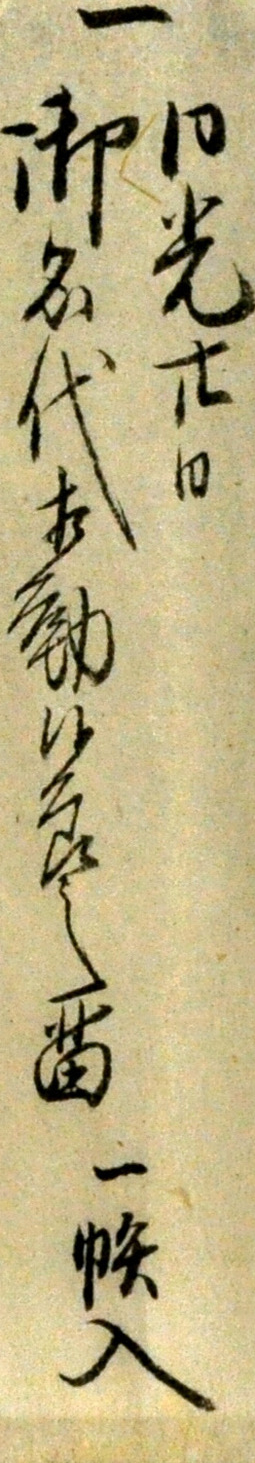御名代相勤候節之留一帙入
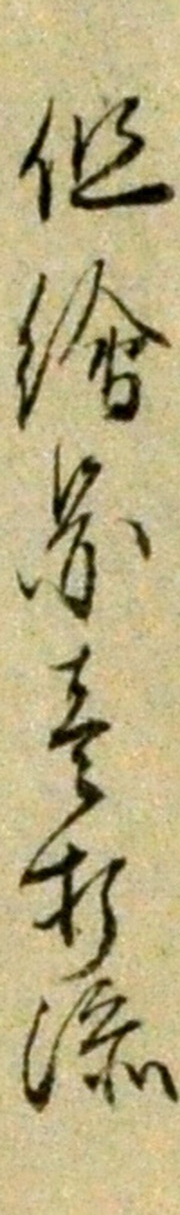但絵図壱折添
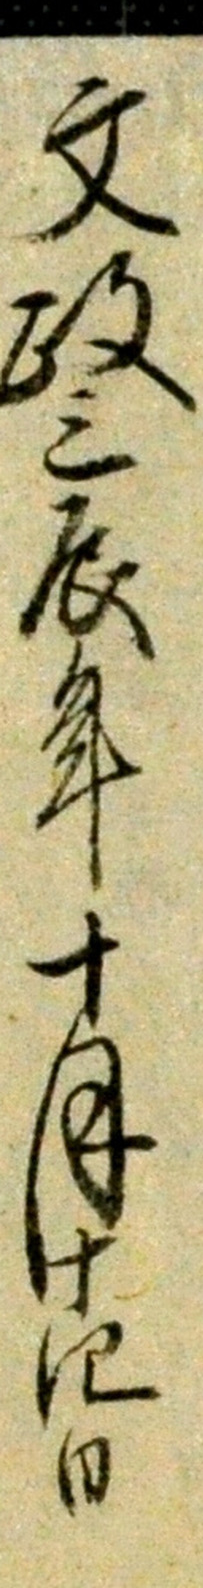文政三辰年十月十四日
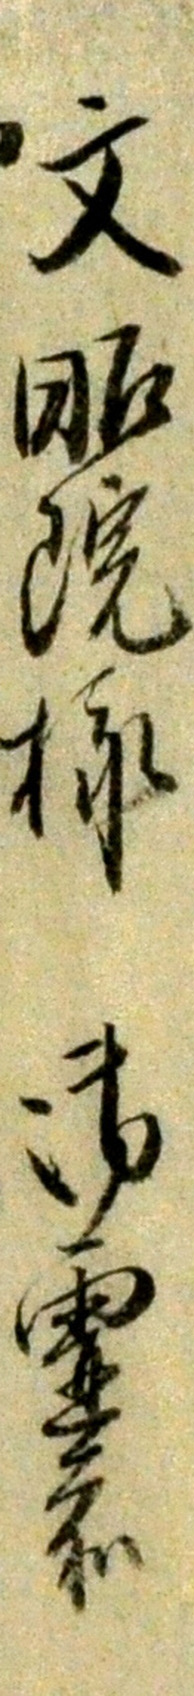文昭院様御霊前
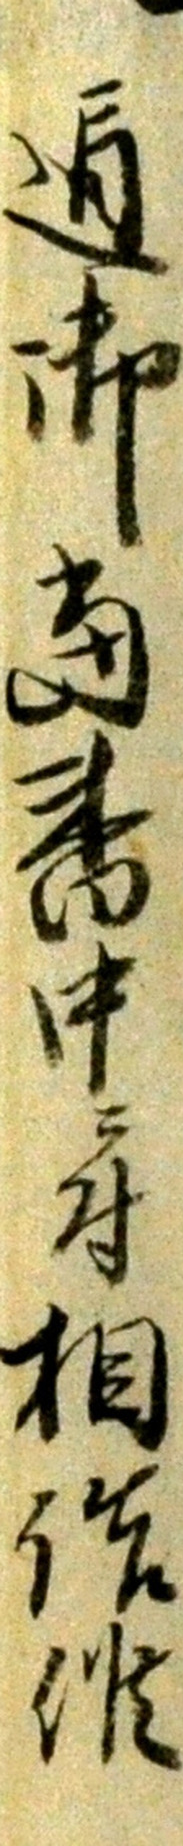通御当番中ニ付相詰候
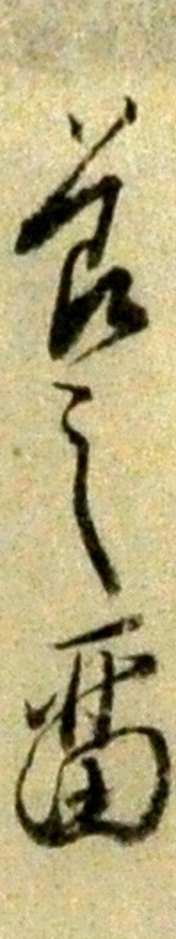節之留
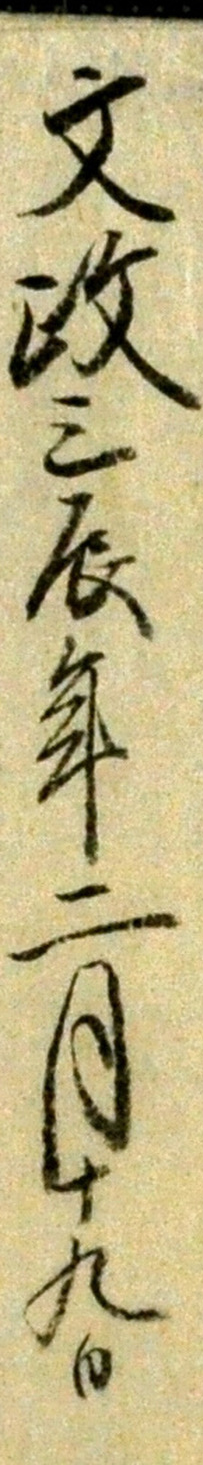文政三辰年二月十九日
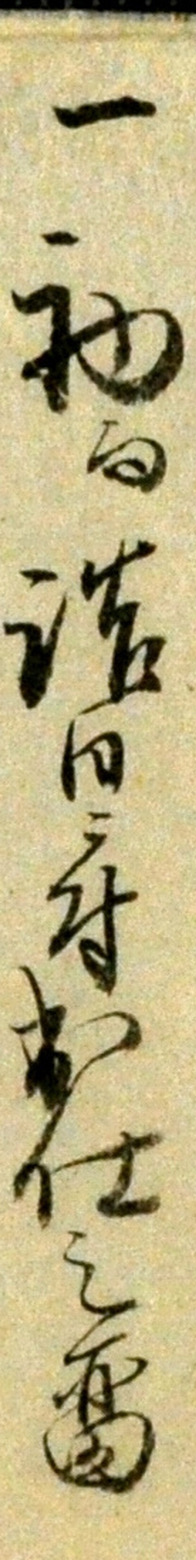一初而詰日ニ付出仕之留同
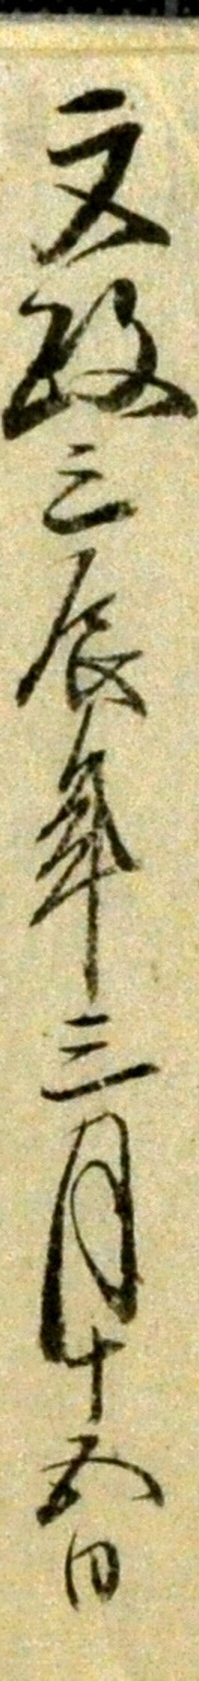文政三辰年三月十五日
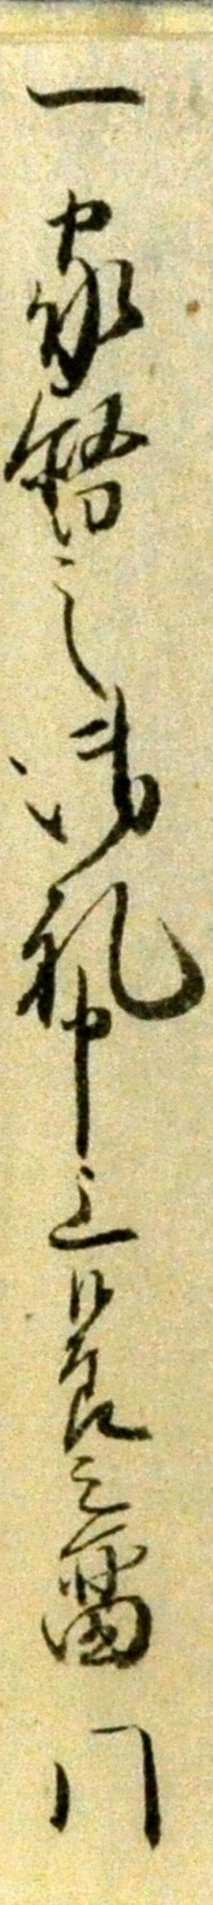一家督之御礼申上候節之留同
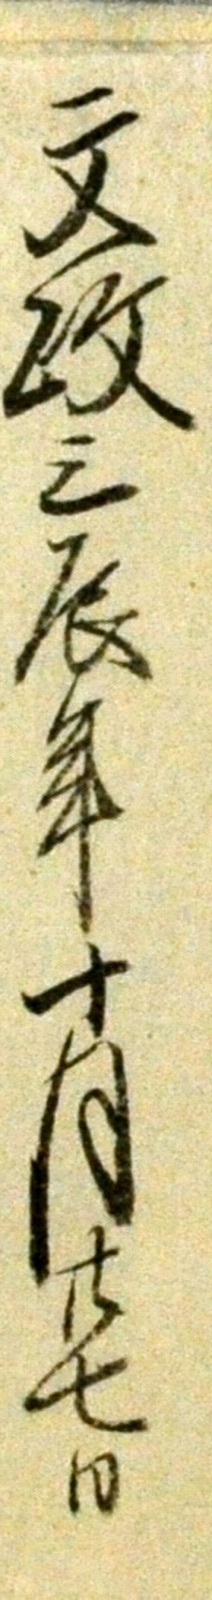文政三辰年十月廿七日
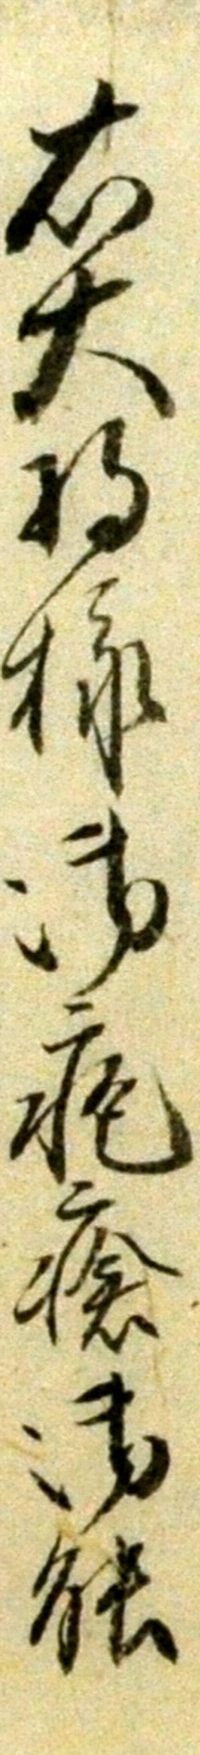右大将様御疱瘡御能同
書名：雁ノ間御留目録奏者番留書目録
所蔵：伊那市立高遠町図書館・合同会社AMANE
